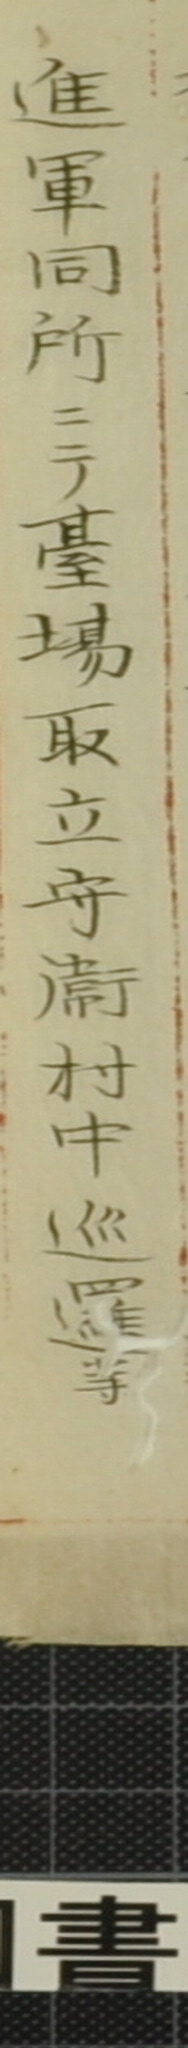進軍同所ニテ台場取立守衛村中巡邏等

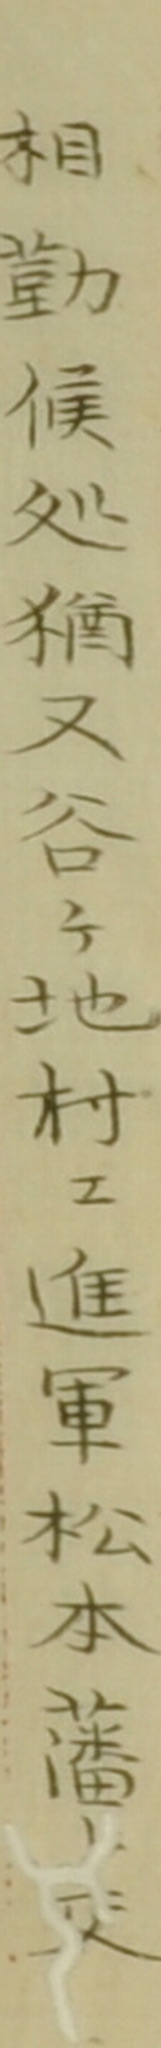相勤候処猶又谷ヶ地村エ進軍松本藩ト交
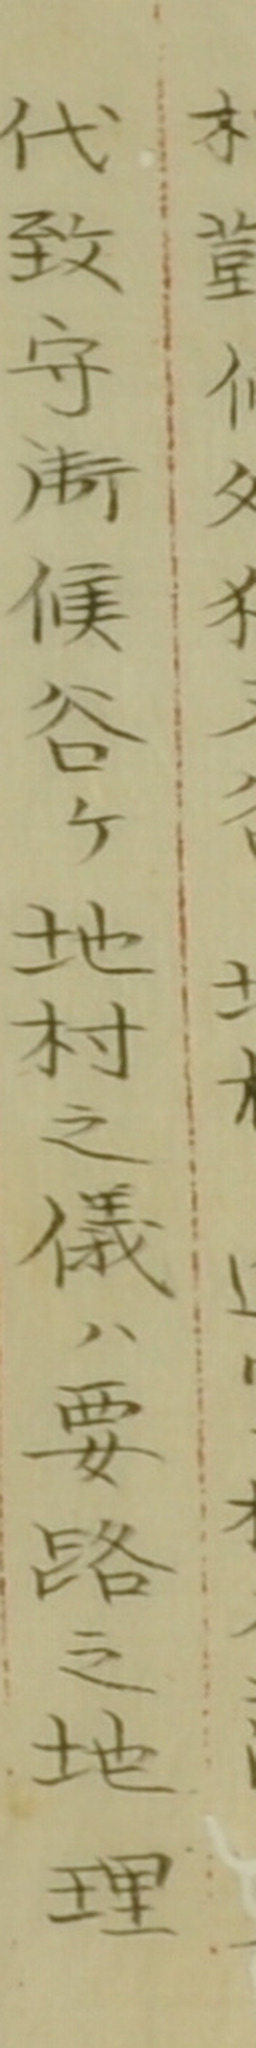代致守衛候谷ヶ地村之儀ハ要路之地理
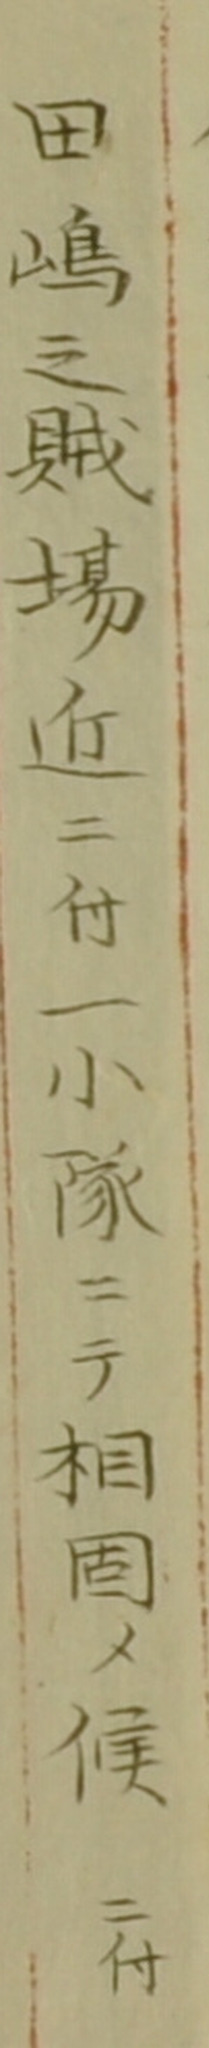田嶋之賊場近ニ付一小隊ニテ相固メ候ニ付
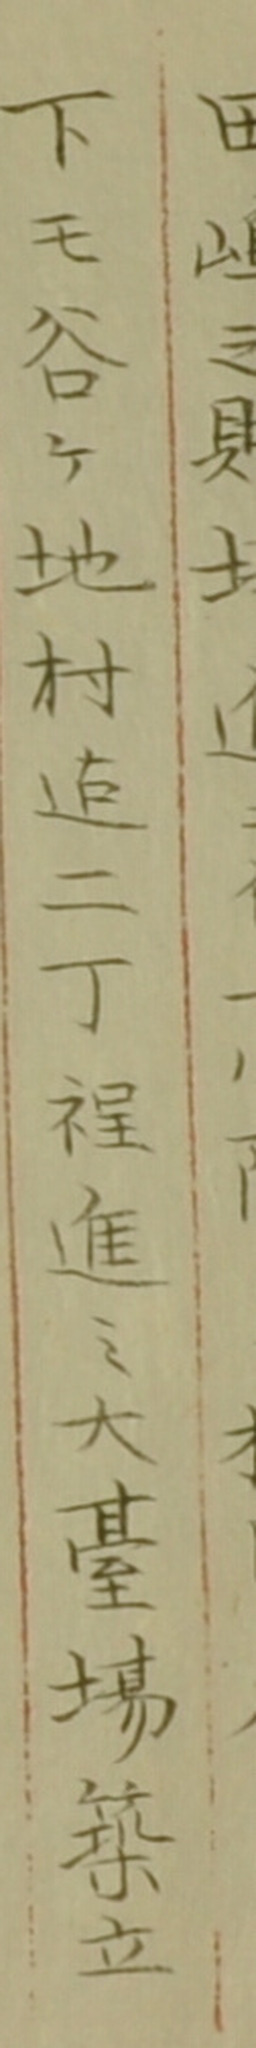下モ谷ヶ地村迄二丁程進ミ大台場築立
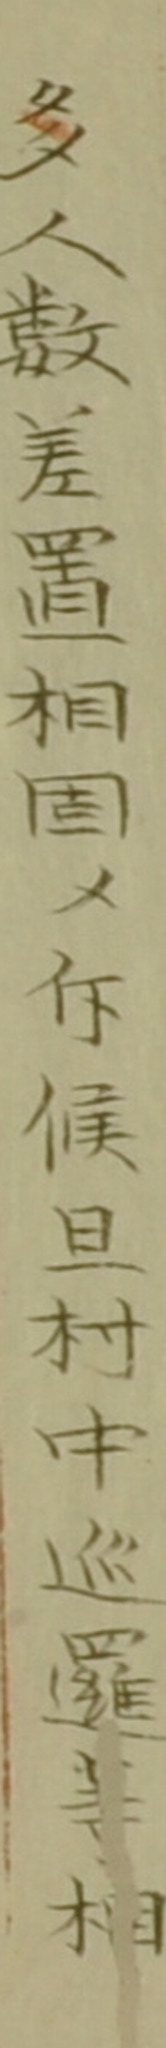多人数差置相固メ斥候旦村中巡邏等相
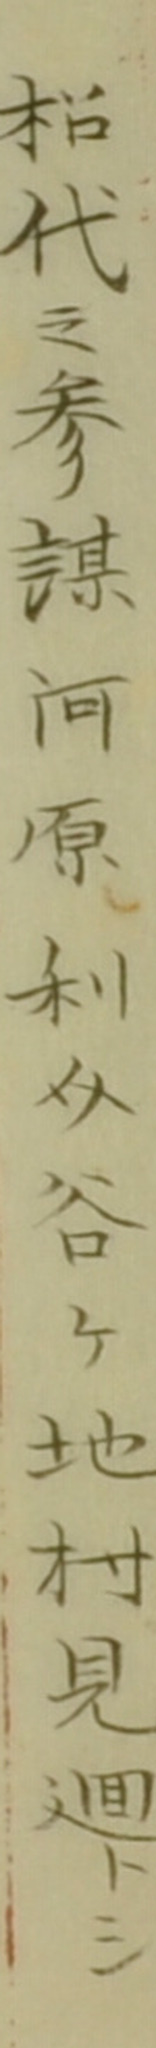松代河原利介谷ヶ地村見廻トシ
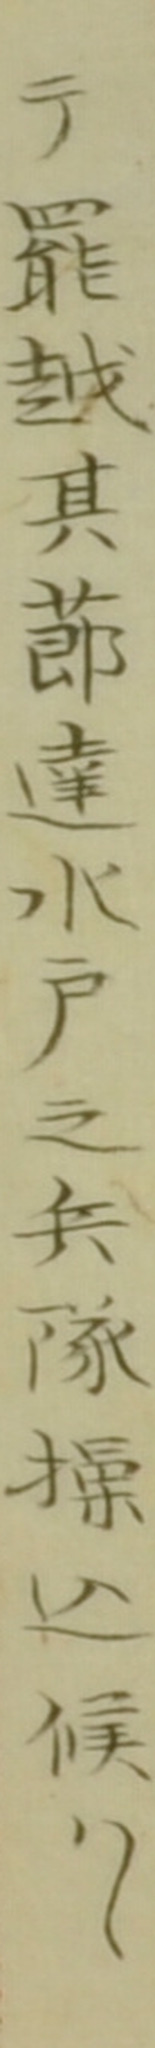テ罷越其節達水戸之兵隊操込候ハヽ
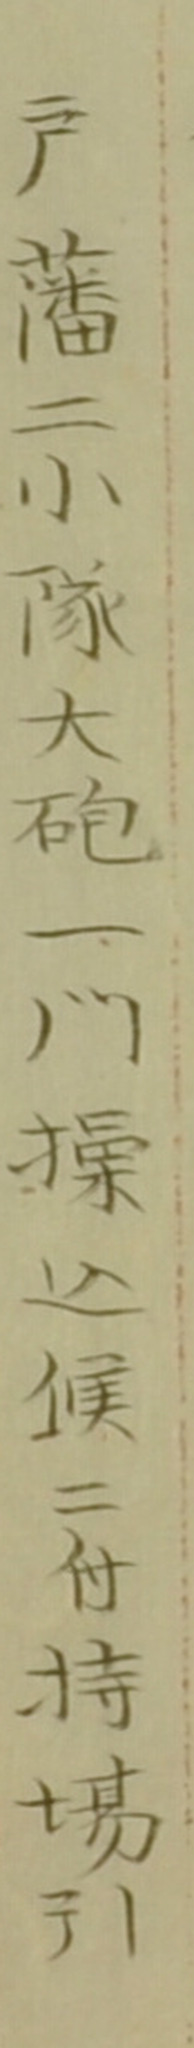戸藩二小隊大砲一門繰込候ニ付持場引
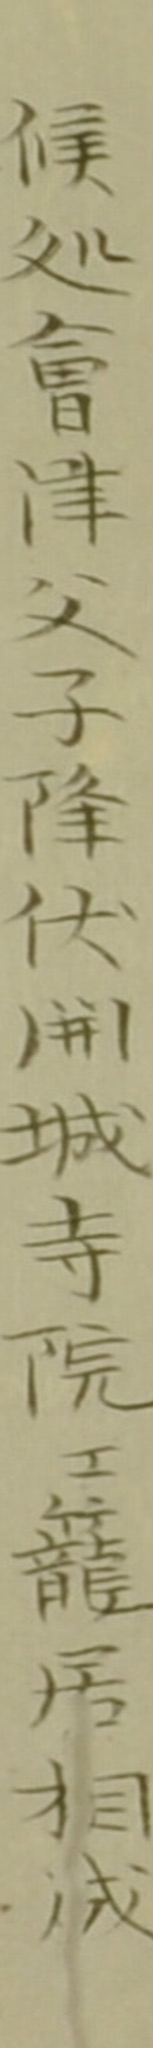候処会津父子降伏開城寺院エ籠居相成
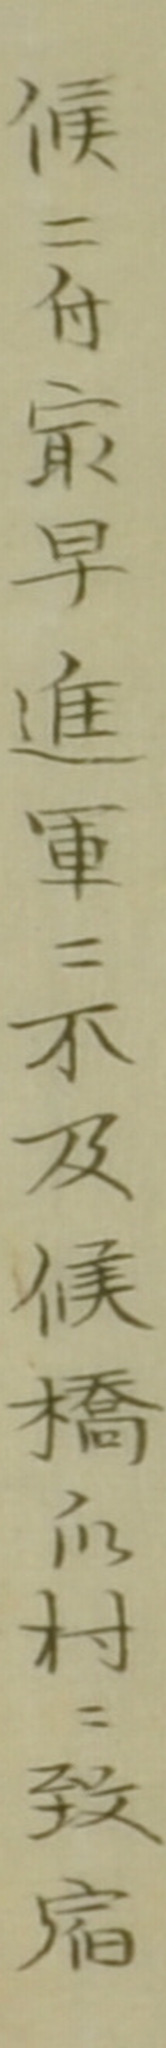候ニ付最早進軍ニ不及候橋爪村ニ致宿
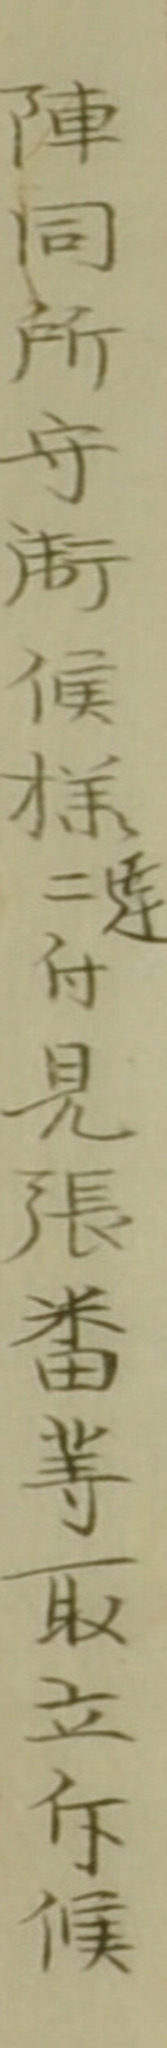陣同所守衛候様ニ付見張番等取立斥候
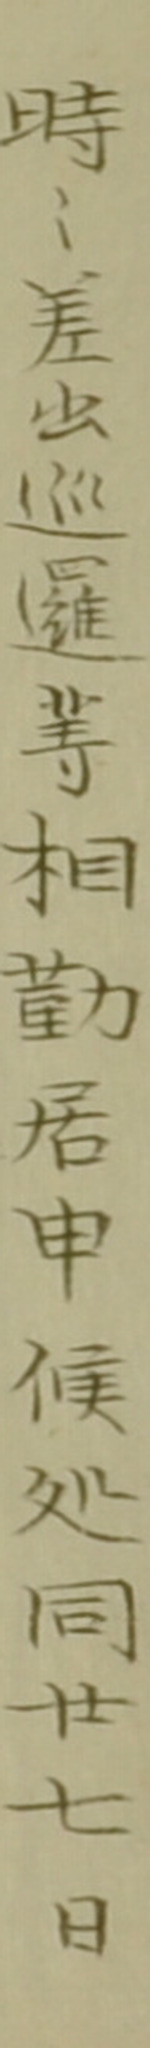時々差出巡邏等相勤居申候処同廿七日
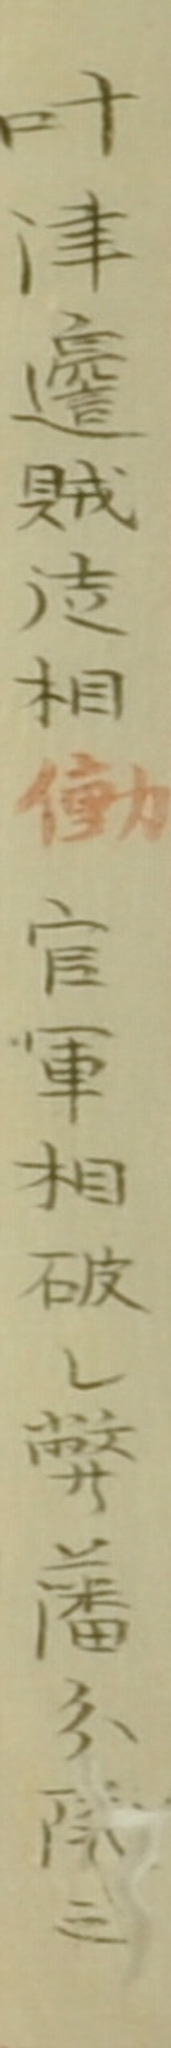叶津辺賊徒官軍相破レ弊藩分隊之

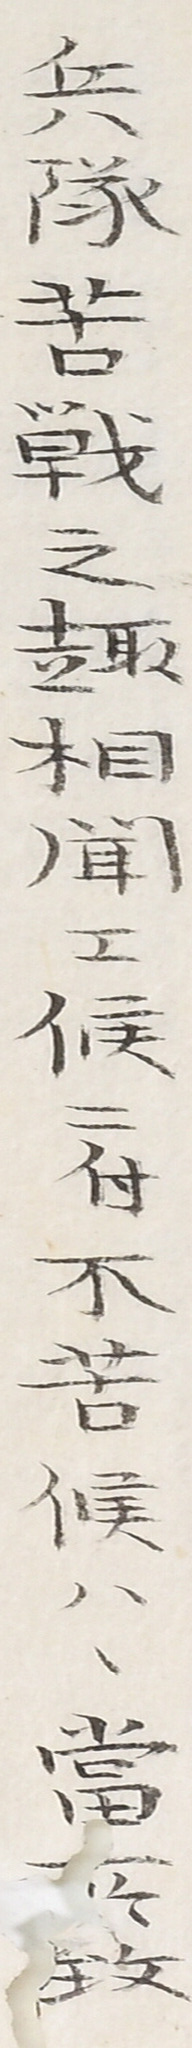兵隊苦戦之趣相聞エ候ニ付不苦候ハヽ当所致
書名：奥越出兵中戦争之事件概略抄録（控）
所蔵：伊那市立高遠町図書館・合同会社AMANE
